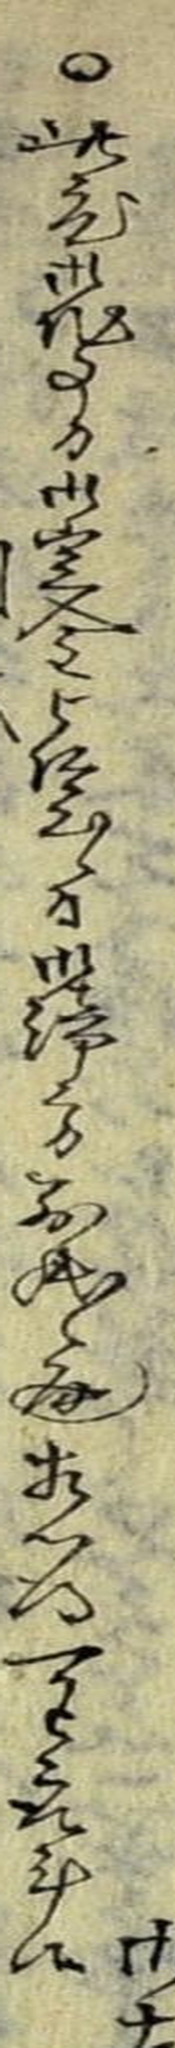○此度御作事方御定金被仰出候付御締方別紙之通相心得可被取計候
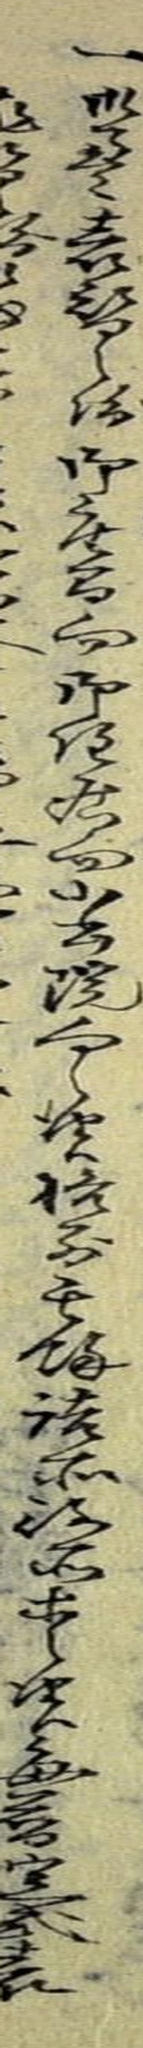一御畳表替之儀御座間向御住居向小書院向之儀ハ格別其余詰所等之儀ハ毎暮定式表
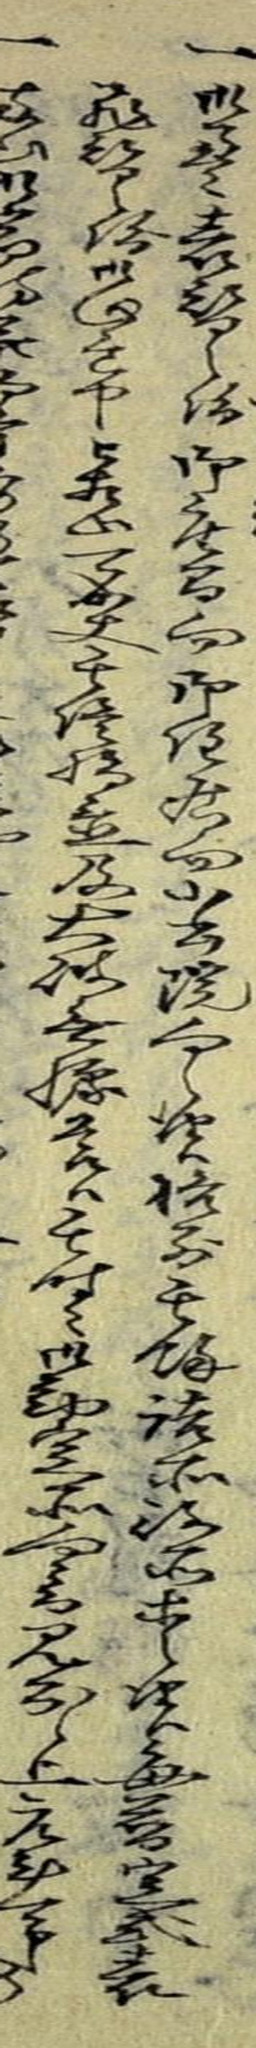飛替之儀御趣意中被相止可成丈其儘指置及大破無拠節ハ其時々御勤定所向ニ而見分之上取計可申事
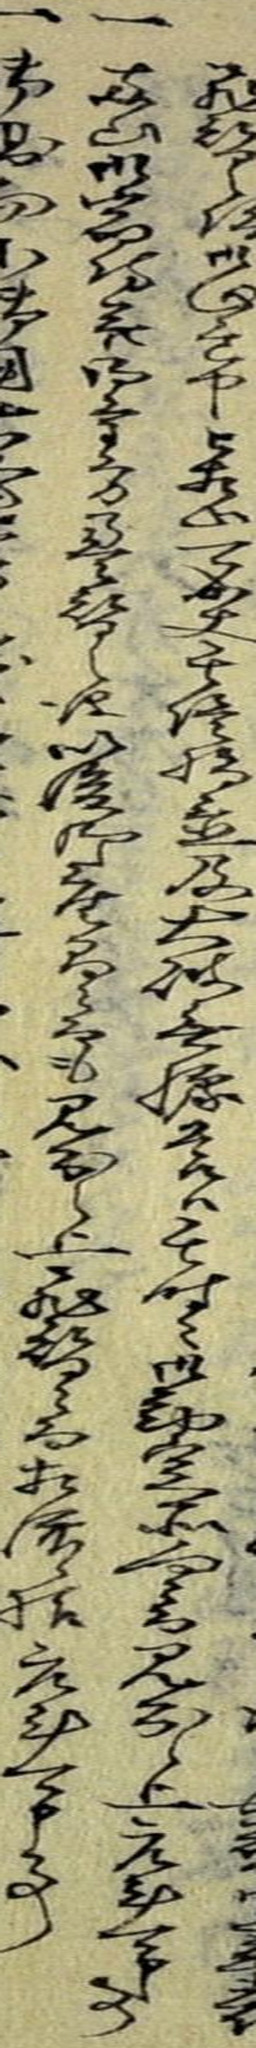一両山御宿坊并御寺方畳替之儀以後御座間ニ而も見分之上飛替ニ而相済候様取計可申事
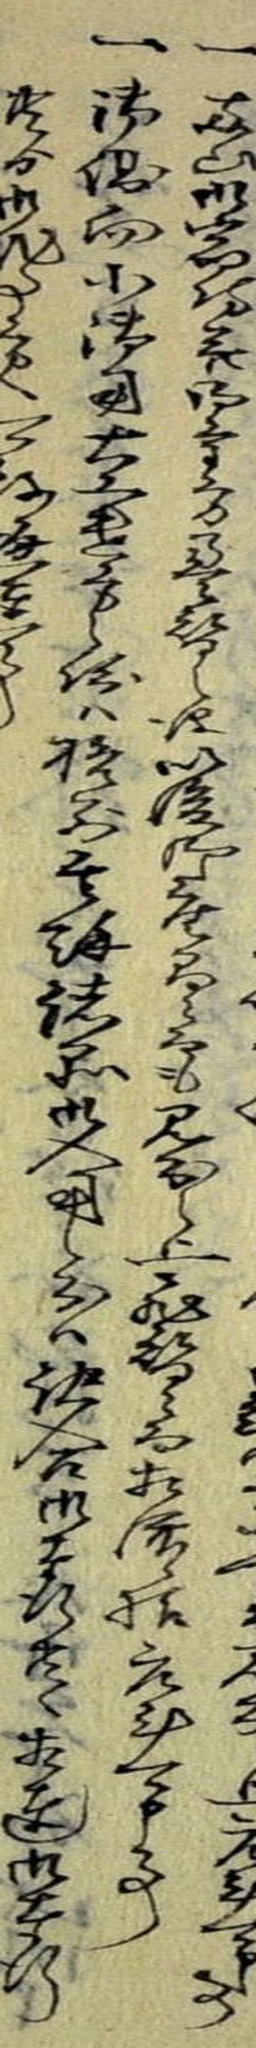一御側向御御用大工遣方之儀ハ格別其余諸品御入用之分ハ訳合御奉行共へ相達御奉行
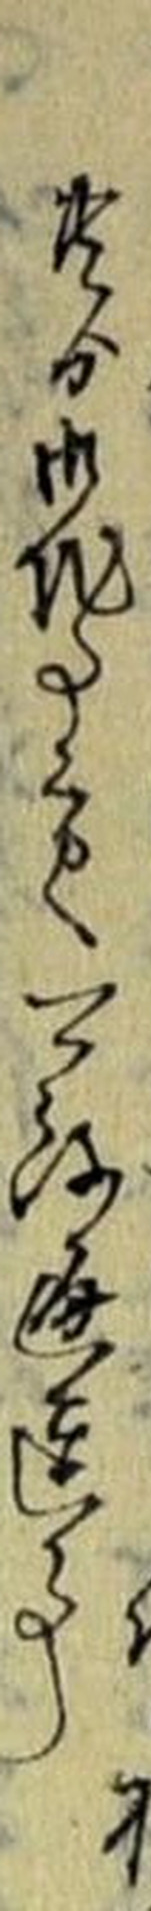共ゟ御作事方へ可致通達事
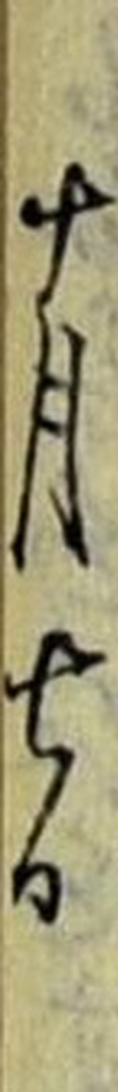十月七日
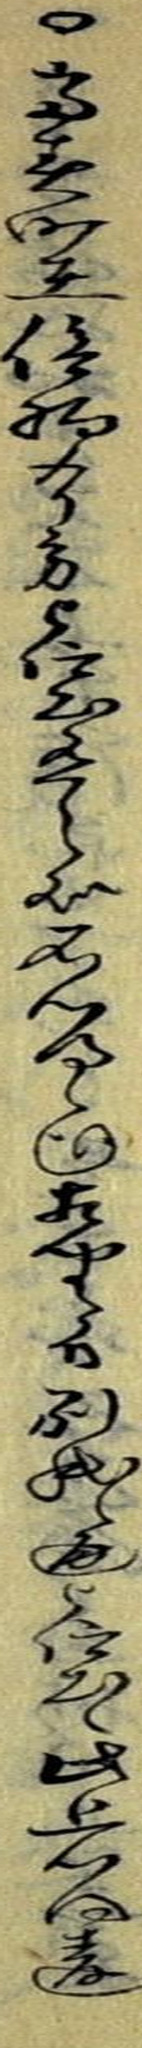○当春町在倹約〆り方被仰出有之処不心得之趣相聞ニ付別紙之通被仰出候此上心得違
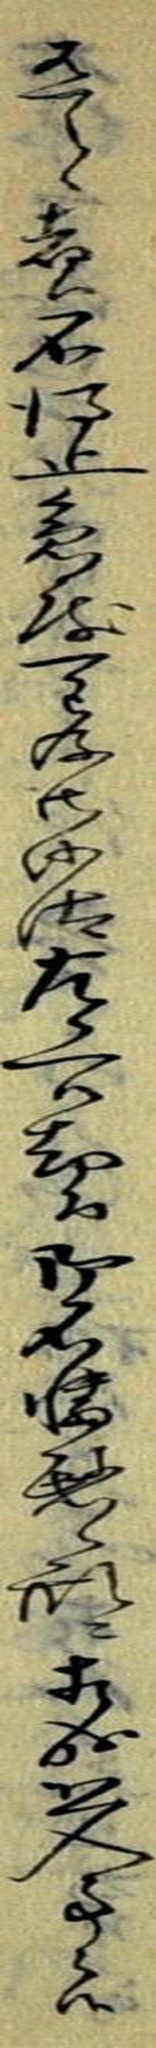有之候者ハ不得止急度可被及御沙汰左候へハ却而御不憐愍之形ニ相成口入事ニ候
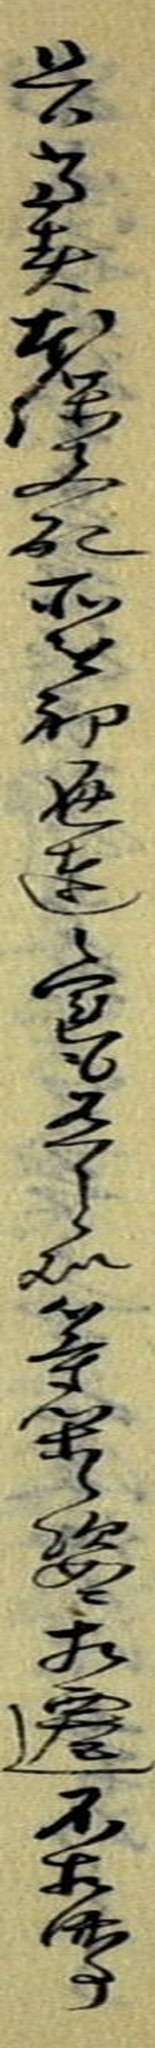且ハ当春本保支配所を初通達之運も有之候処等閑之姿ニ相遷不相済事
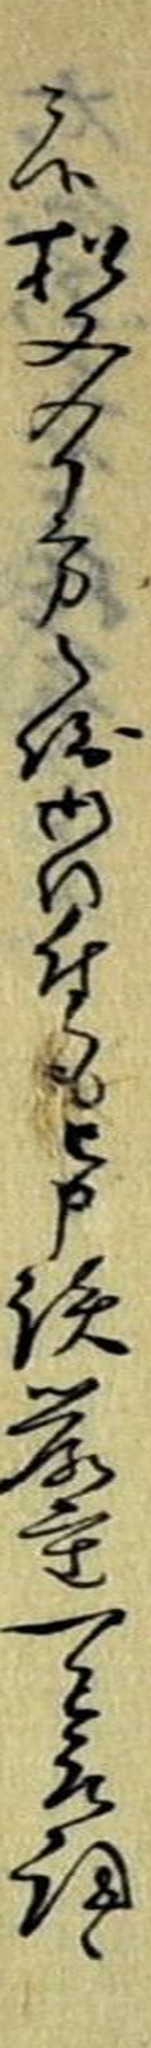ニ候猶又〆り方之儀御目付へも被申談厳重可被取調候
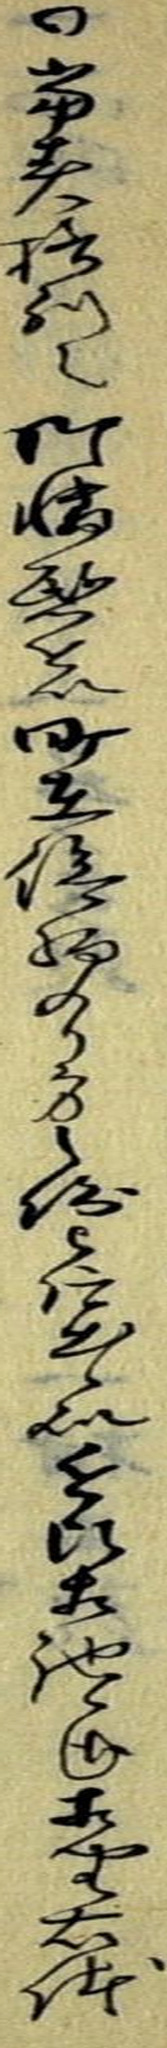○当春格別之御憐愍を以町在倹約〆り方之儀被仰出候処近頃相弛候趣相聞右体
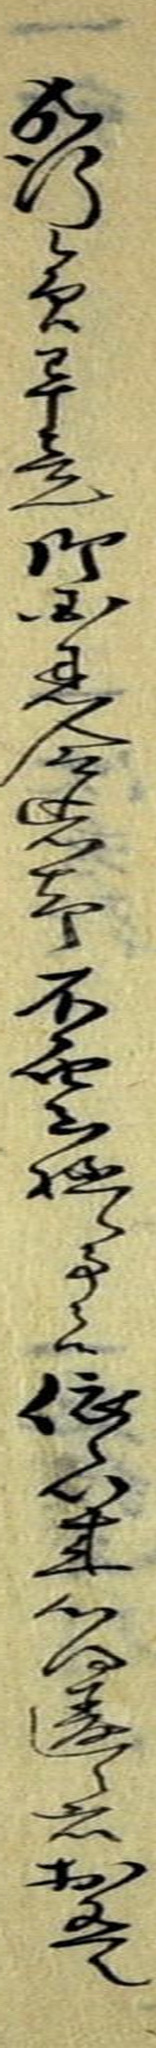成行候而ハ畢竟御国恩令忘却不届至極之事ニ候依之以来心得違之者於有之
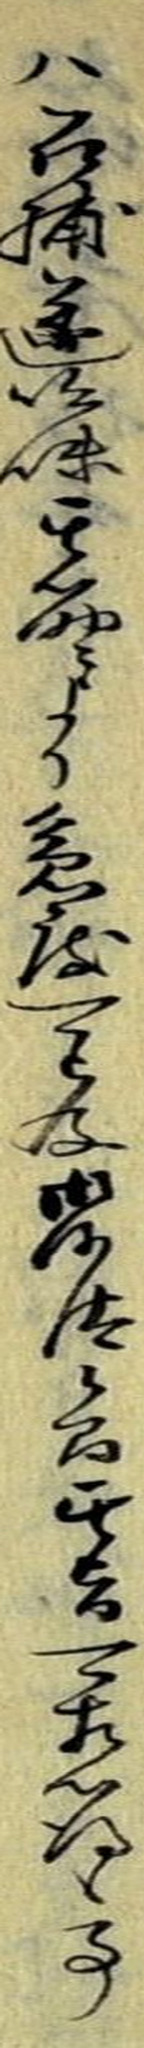ハ召捕遂吟味其筋ニより急度可被及御沙汰候間其旨可相心得候事
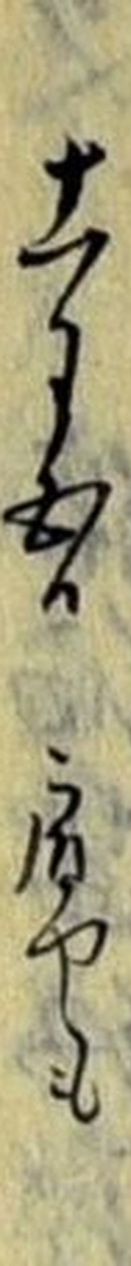十一月五日府中へも
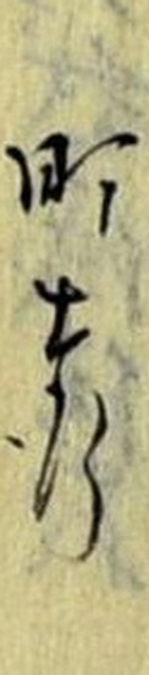町奉行
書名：命令之部 五
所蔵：福井県文書館 Fukui Prefectural Archives
